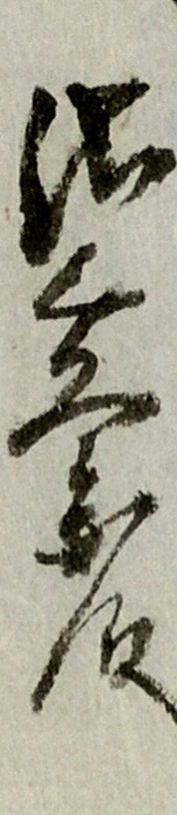辰三月廿一日
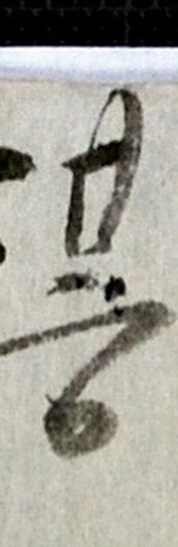廿二日
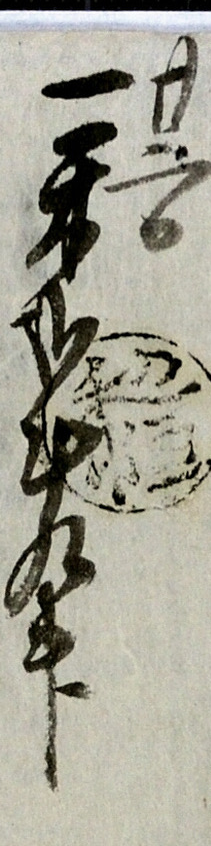一米弐斗九升
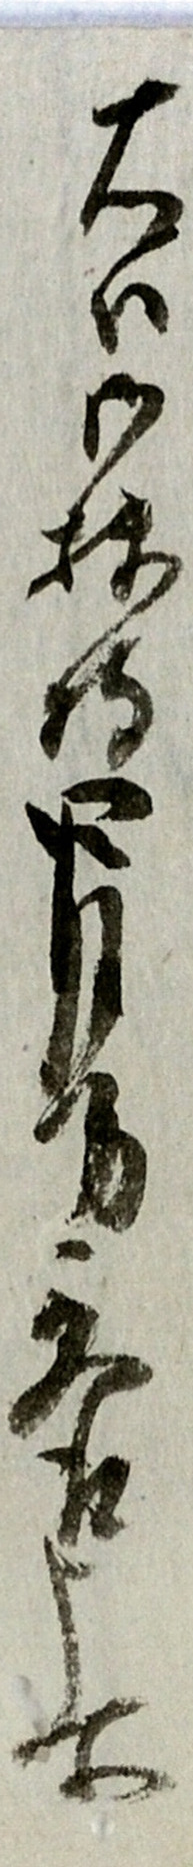右は御扶持四月分受取申所
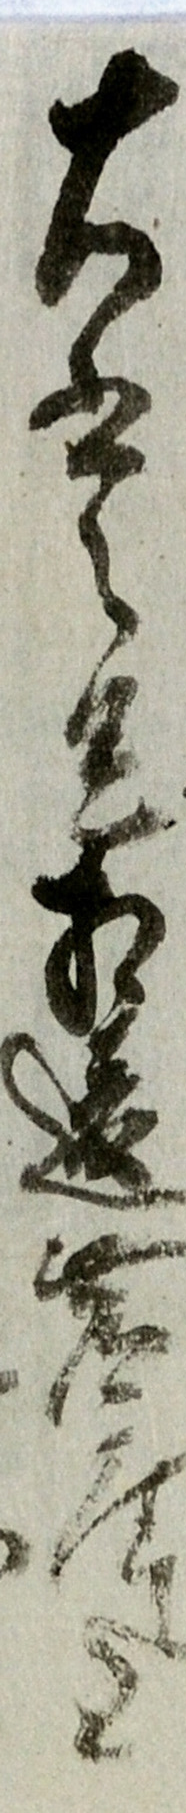右書之通相違無御座候以上
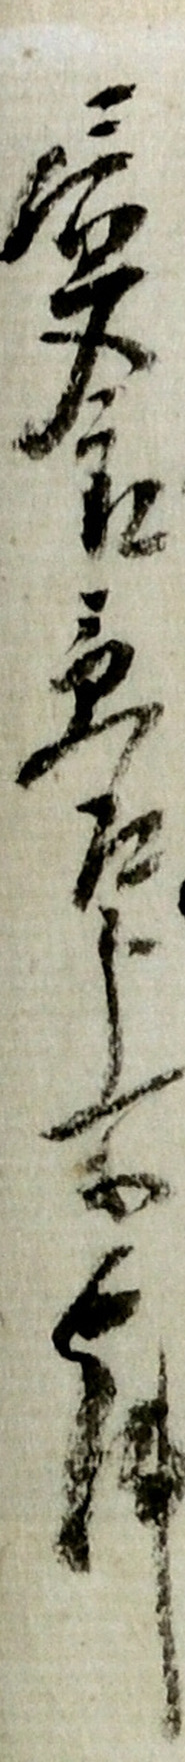昼食受取申所如件

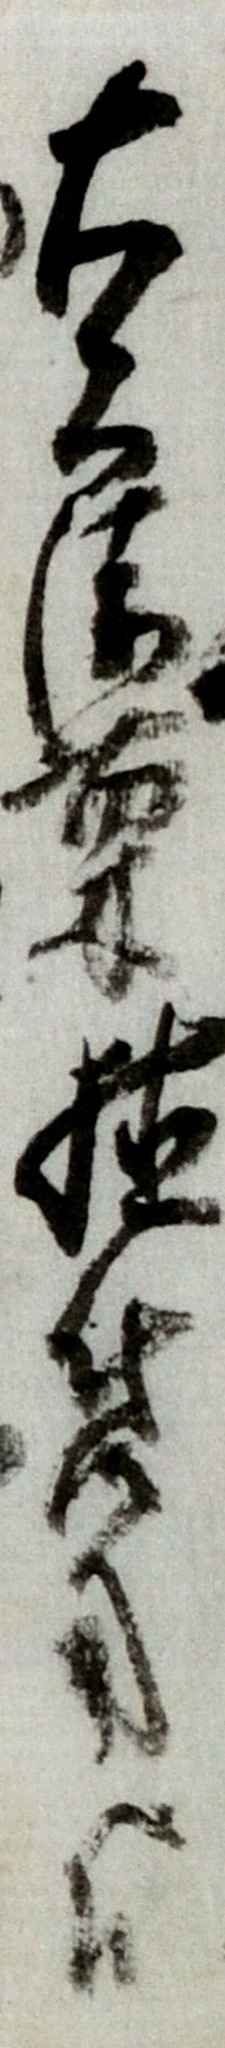右は漆苗木植付御用
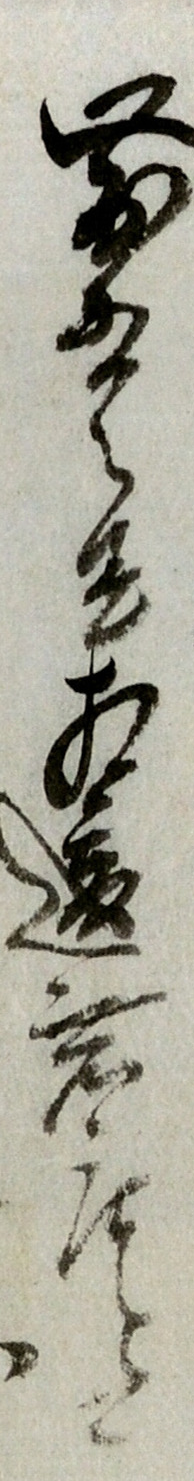前書之通相違無御座候以上
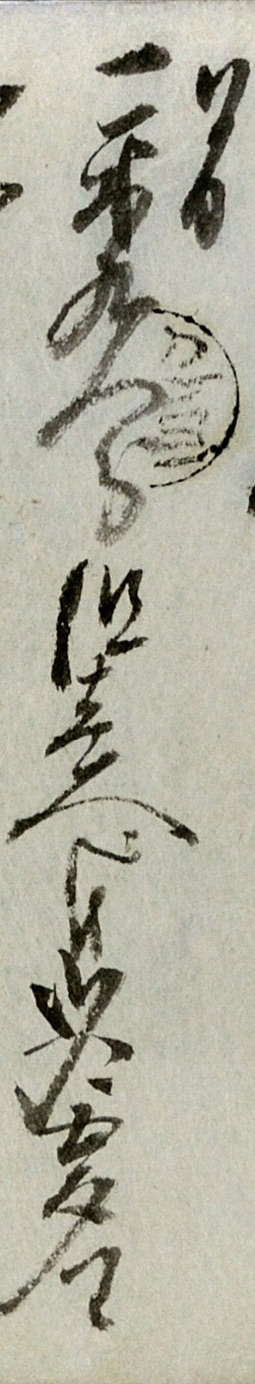一米九人分但壱人ニ付弐合五勺ツヽ
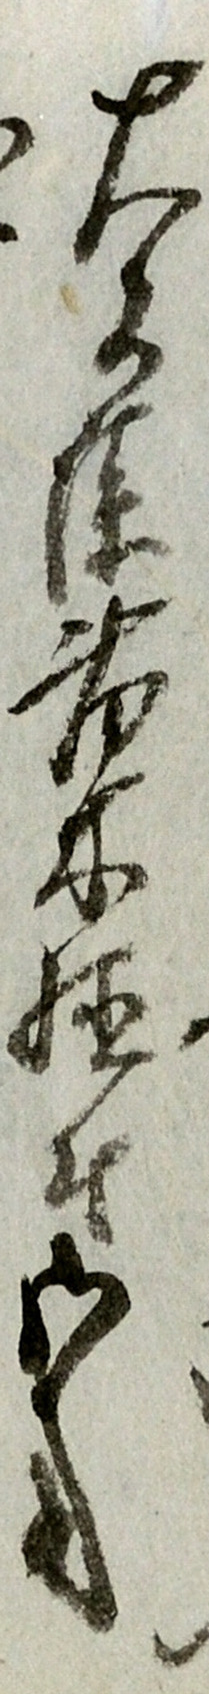右は漆苗木植付御用
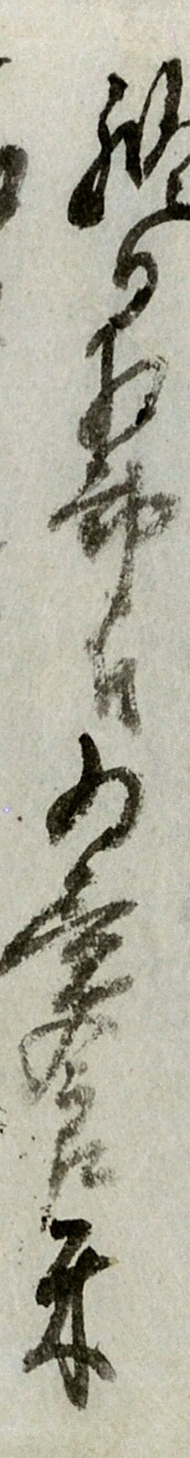終日相勤候ニ付為昼食米
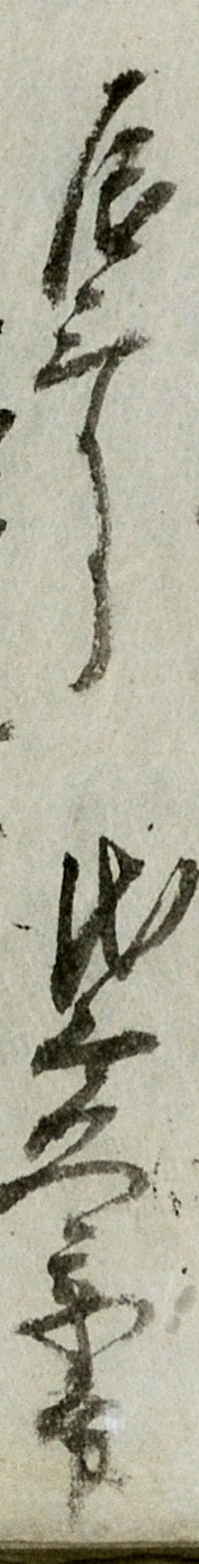辰三月池上久兵衛印
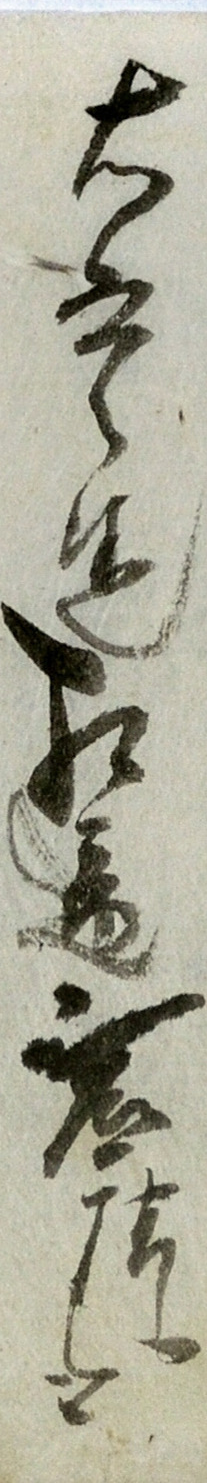右書之通相違無御座候以上
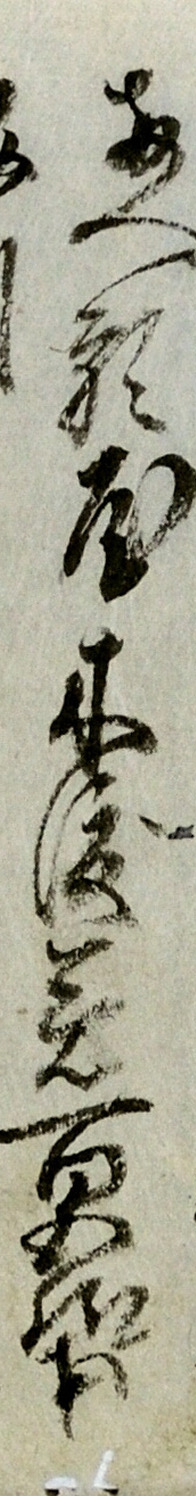両人願屋木渡着百五拾本
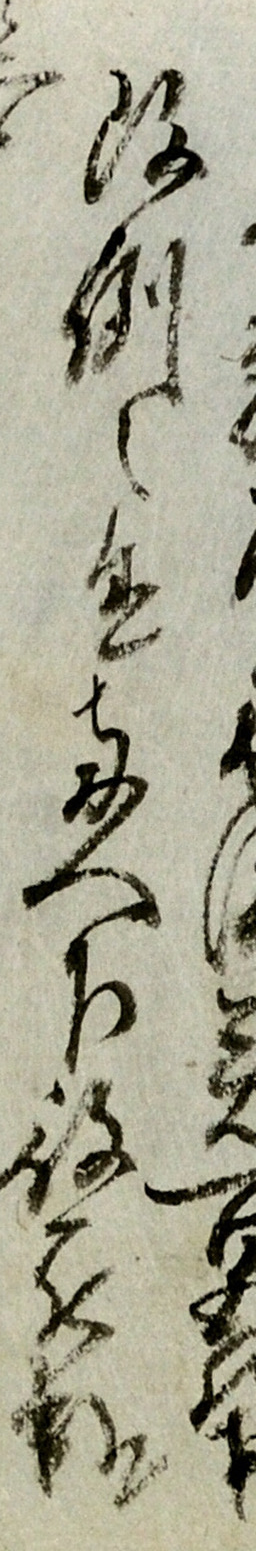改例之通両人下役罷出
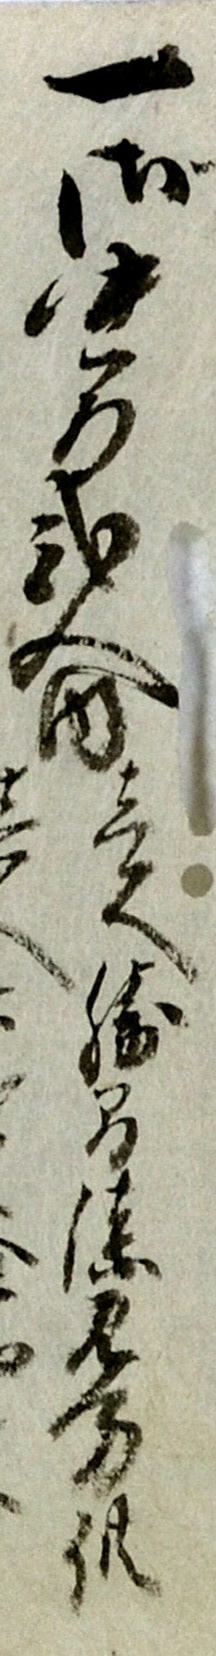一御中間弐人内壱人勝間漆見分供
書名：分一方諸事御用留帳
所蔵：伊那市立高遠町図書館・合同会社AMANE
